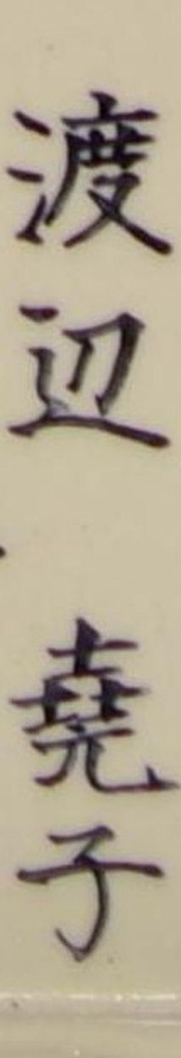渡辺尭子
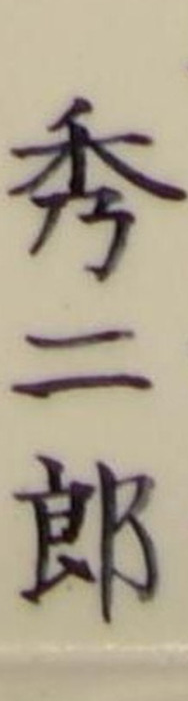秀二郎
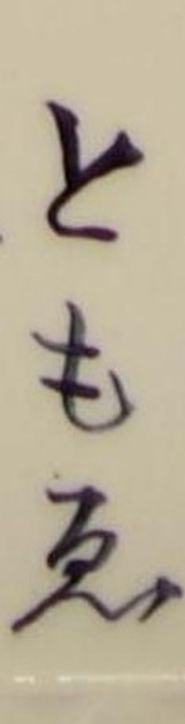ともゑ
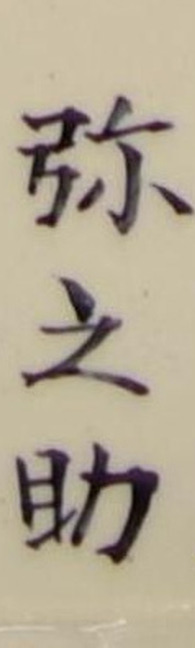弥之助
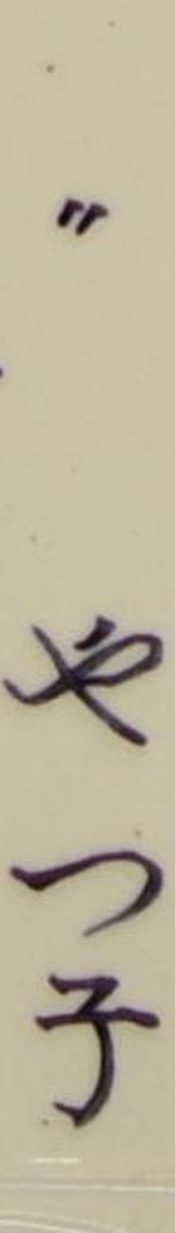やつ子
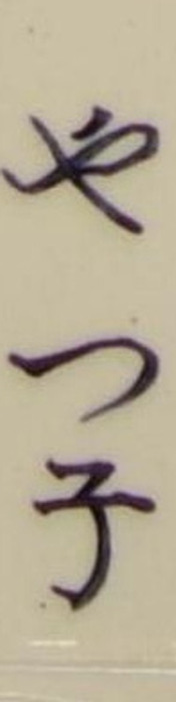やつ子
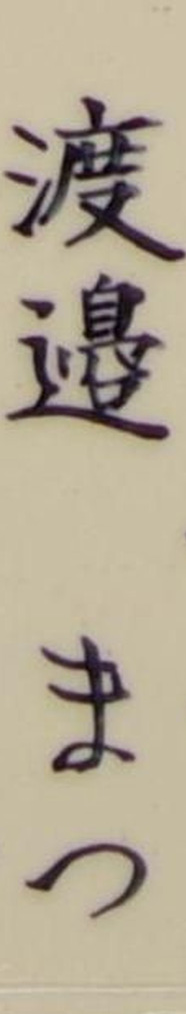渡邉まつ
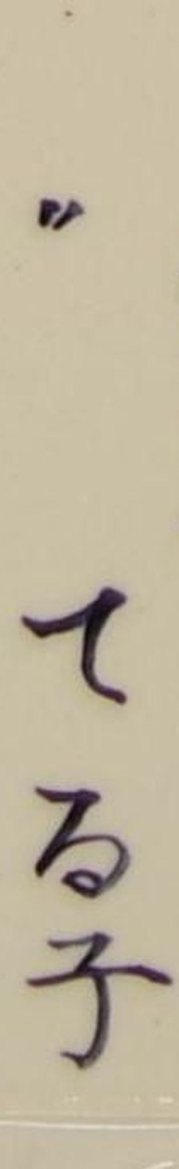てる子
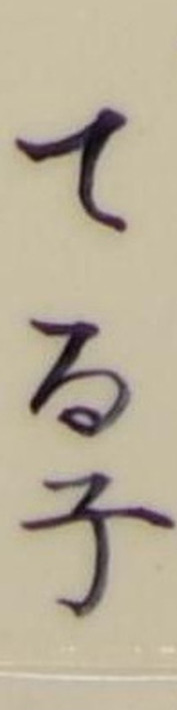てる子
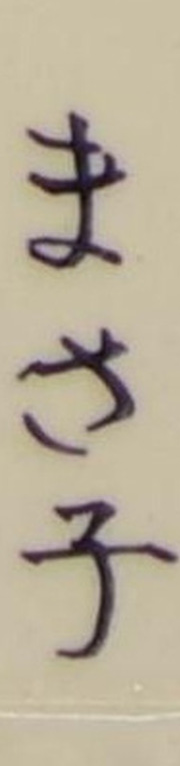まさ子
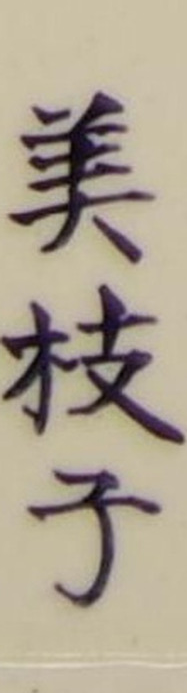美枝子

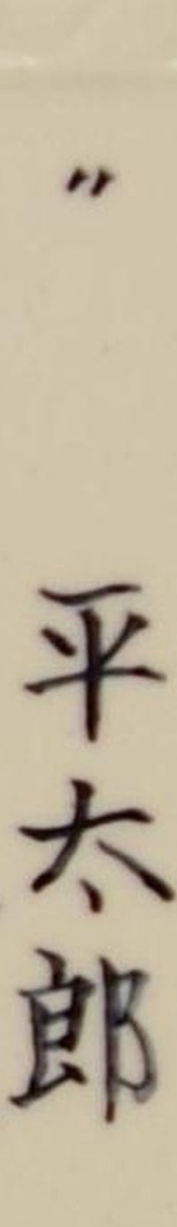平太郎
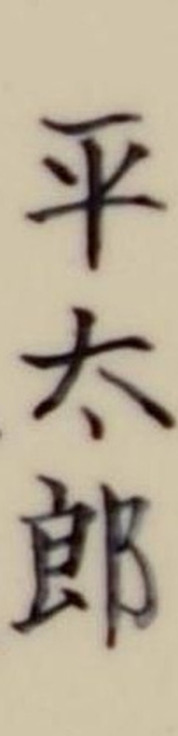平太郎
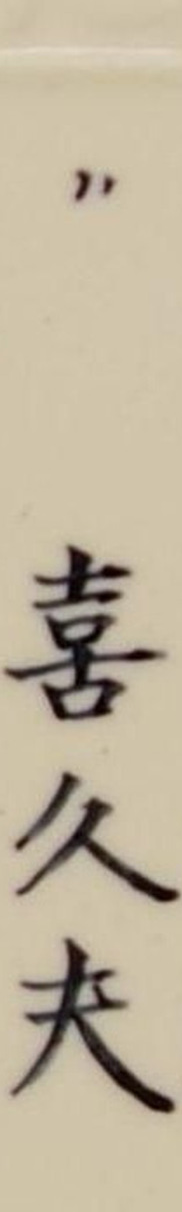喜久夫
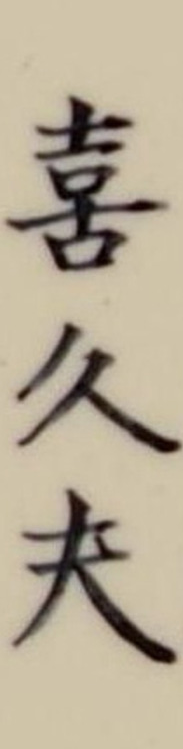喜久夫
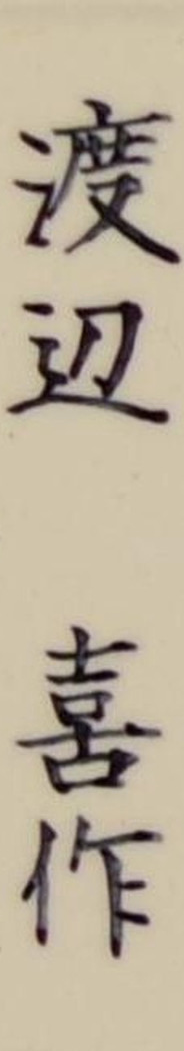渡辺喜作
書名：E~L
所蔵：高野山金剛峯寺
